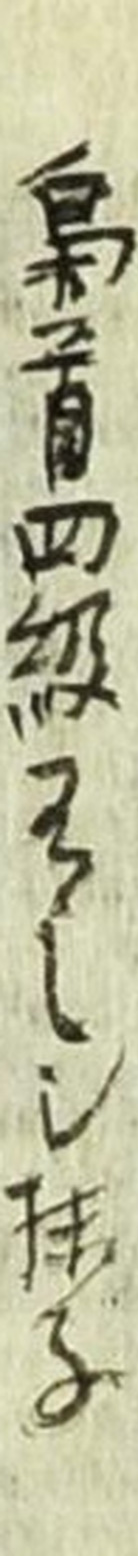梟首四級有之シ様子
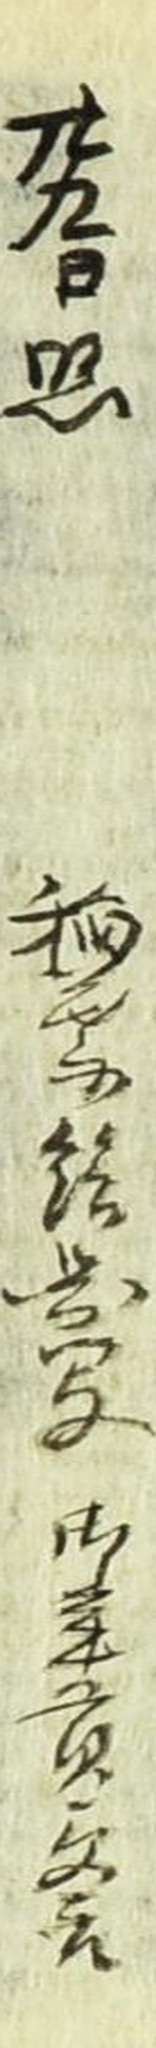廿九日照稲葉絵図写御年貢受取
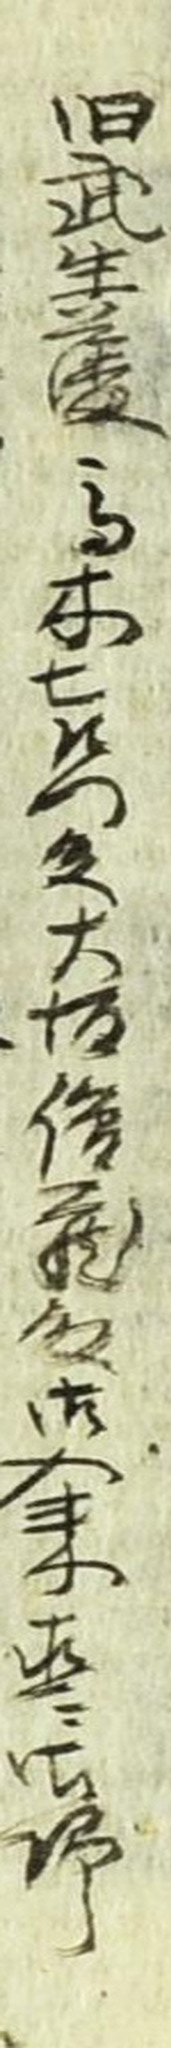旧武生藩高木七左衛門殿大垣俊蔵殿御入来直ニ御帰

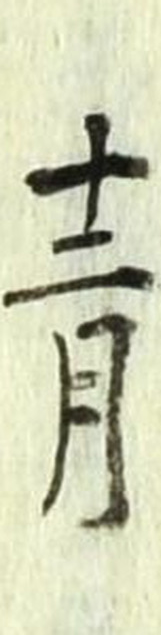十二月
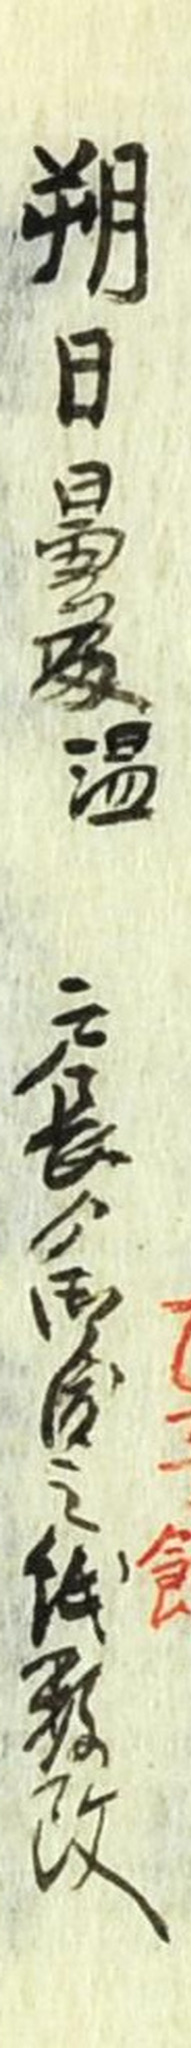朔日曇雨温戸長ゟ御渡之紙数改
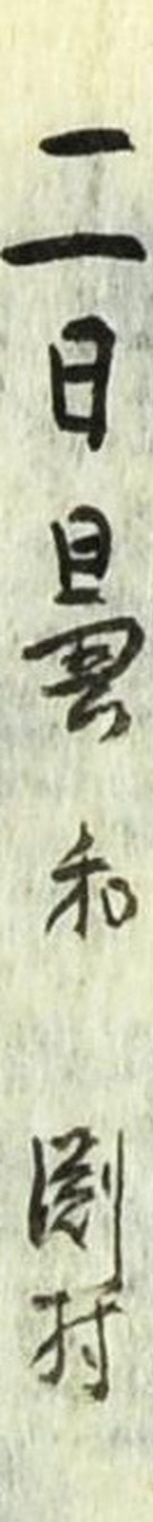二日曇和淵村
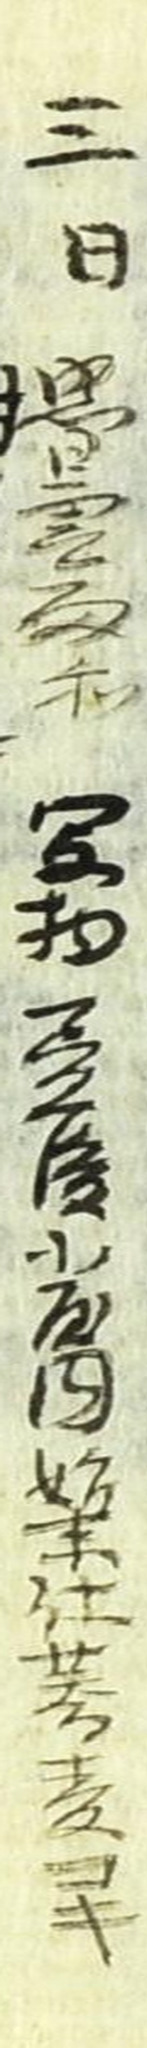三日照曇雨和写物昼後小屋内始末仕蕎麦コキ
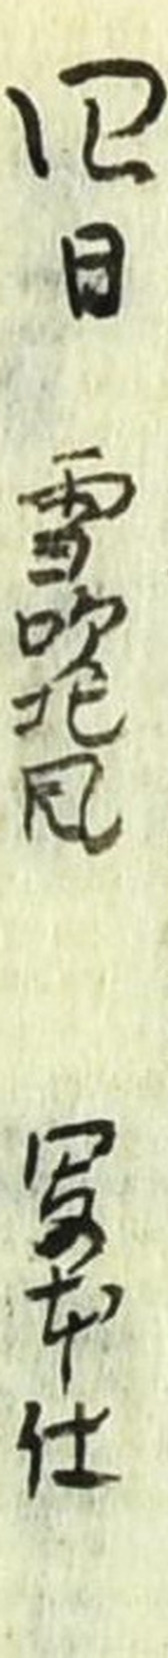四日雪吹北風写本仕
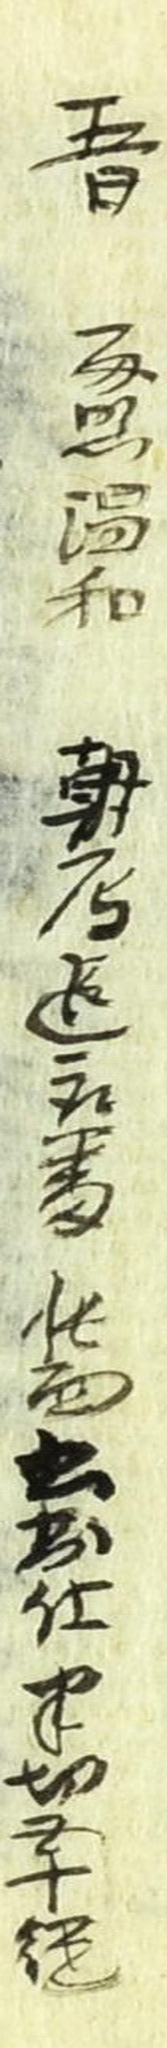五日雨照温和朝雁追取番帳面書出仕半切五十継
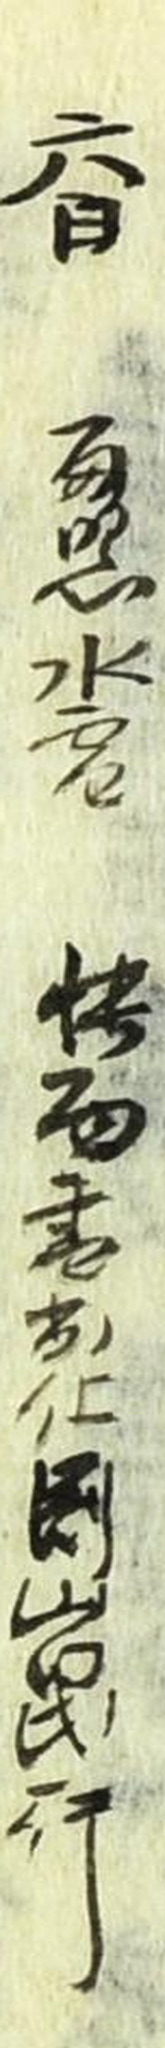六日雨照水雪帳面書出仕淵山田氏行
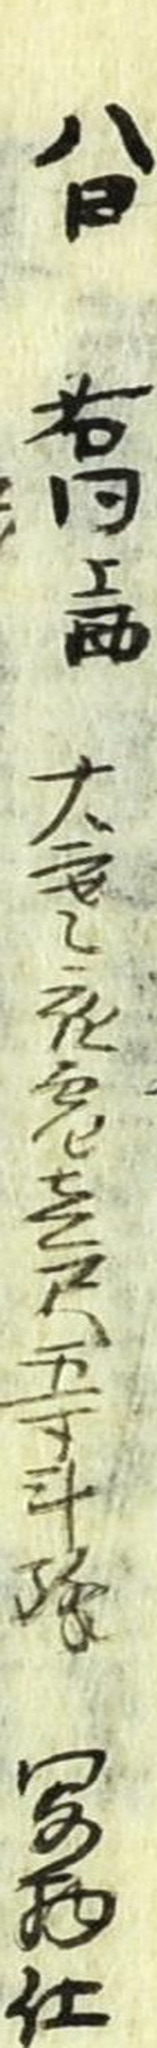八日右同上西大寒夜雪壱尺五寸計降写物仕
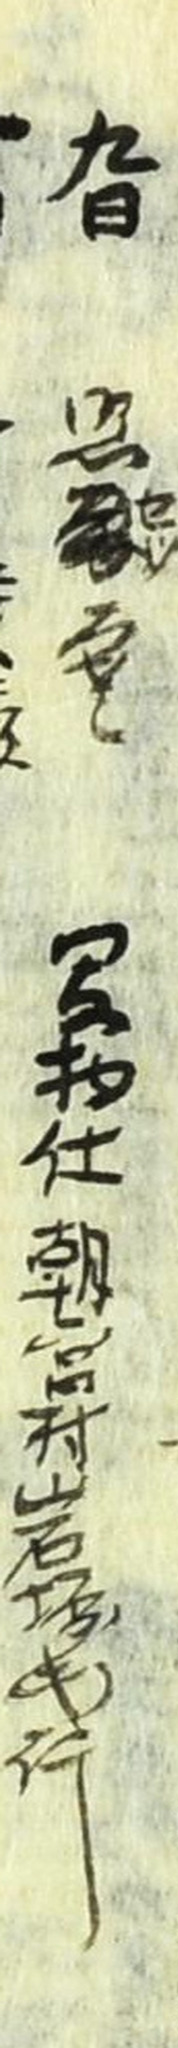九日照雪寒写物仕朝宮村岩堀氏行
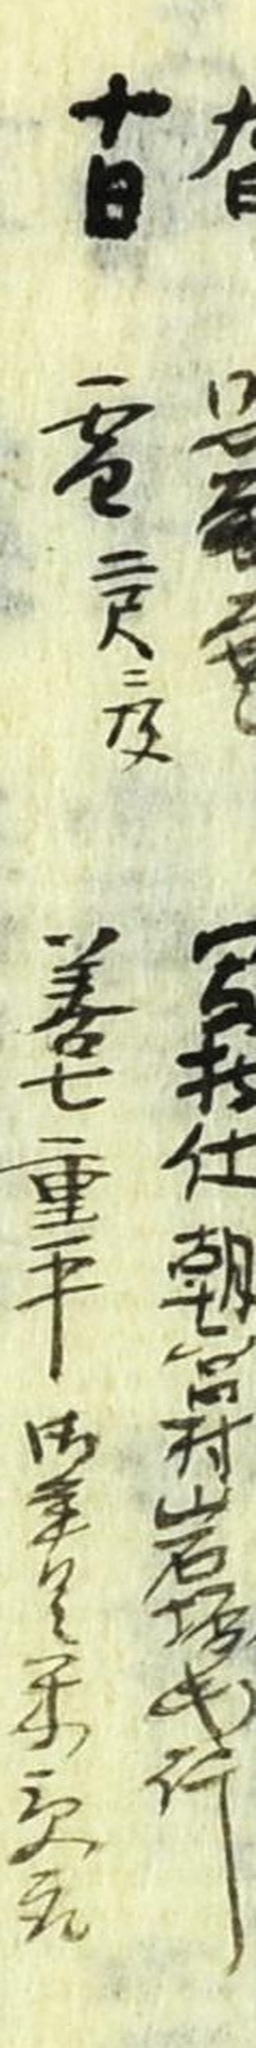十日雪二尺に及善七重平御年具米受取
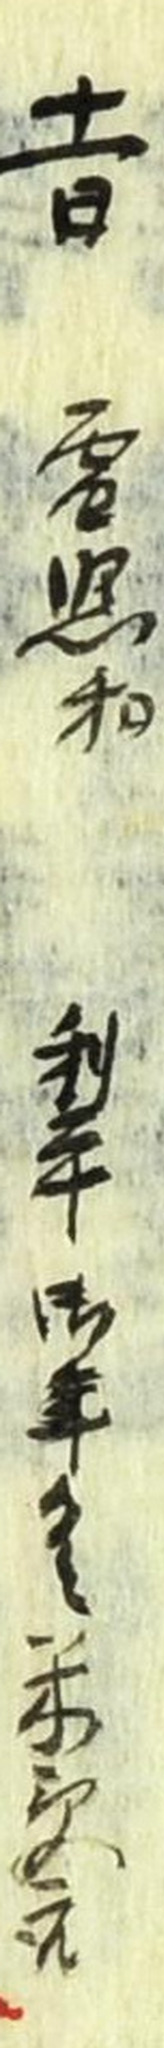十一日雪照和利平御年具米受取
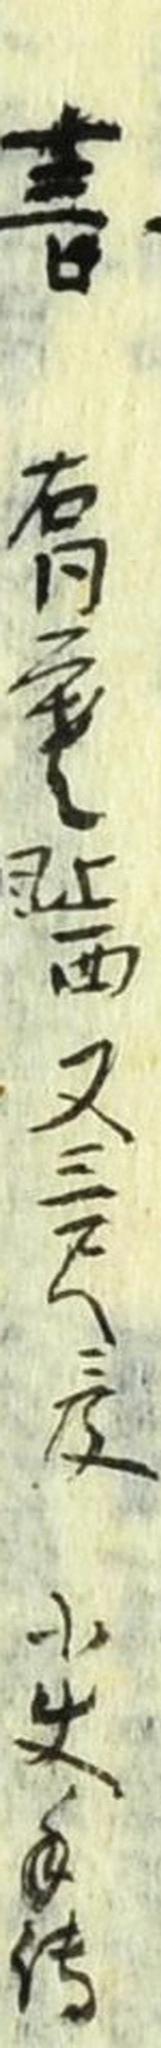十三日右同寒上西風又三尺に及小使手伝
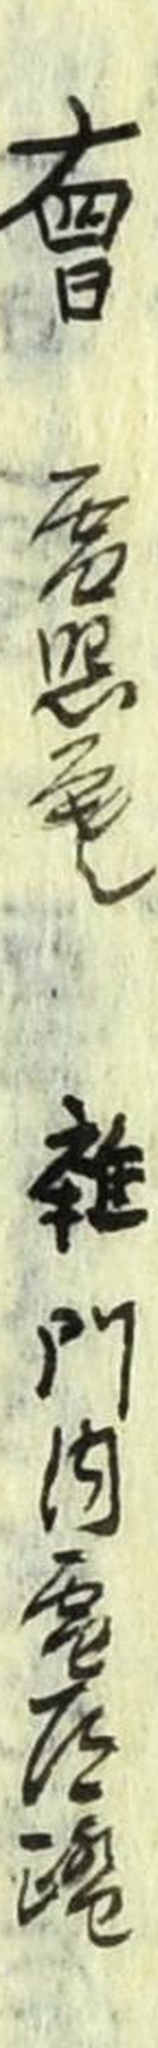十四日雪照寒雑門内雪道踏
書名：（日記）
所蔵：福井県文書館 Fukui Prefectural Archives
